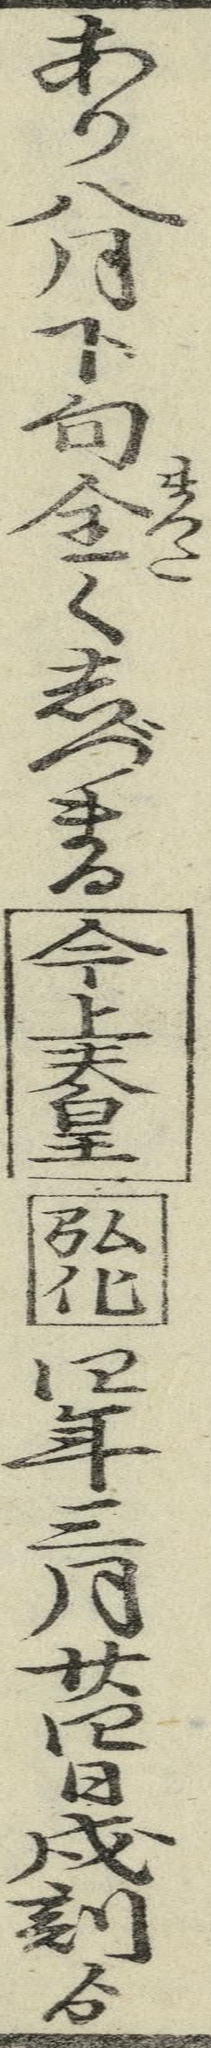あり八月下旬全くしづまる今上天皇弘化四年三月廿四日戌刻ゟ
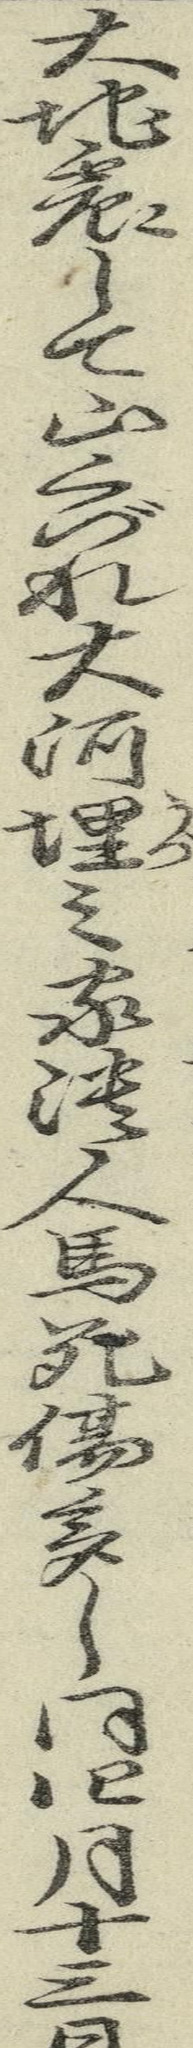大地震して山くづれ大河埋み家潰人馬死傷多し同四月十三日
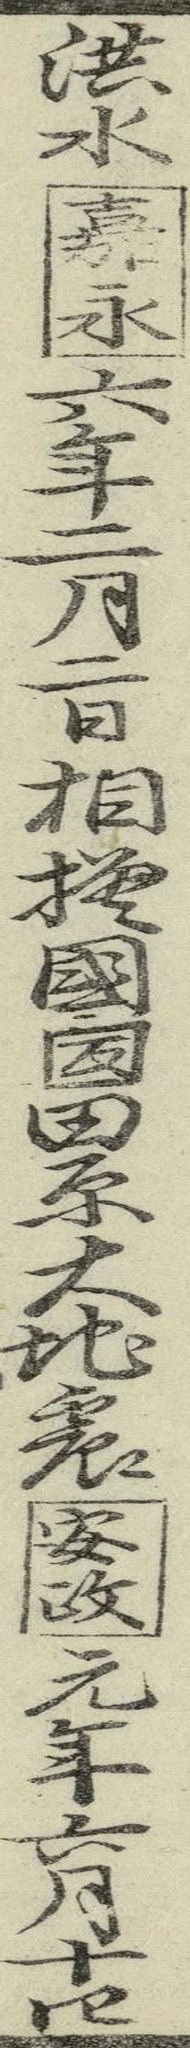洪水嘉永六年二月二日相模国田原大地震安政元年六月十四
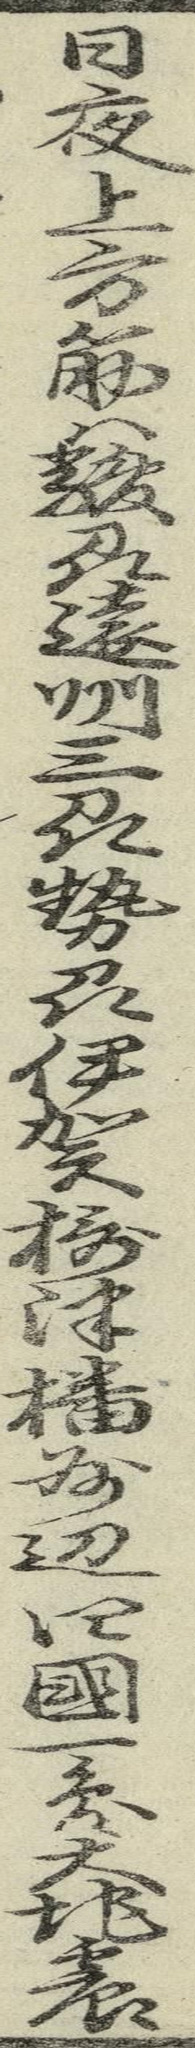日夜上方筋は駿州遠州三州勢州伊賀摂津播州辺四國一円大地震
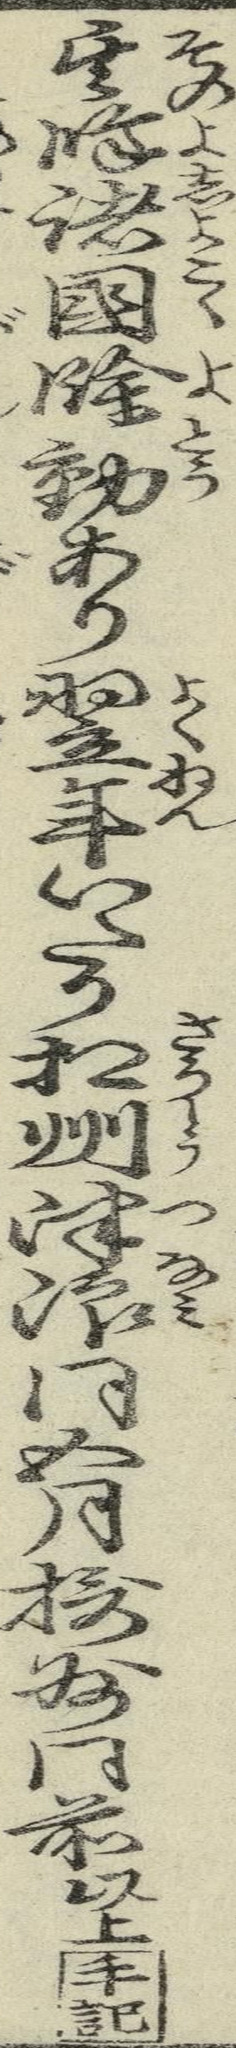其余諸国余動あり翌年いたり相州津浪同五月摂州同前以上手記
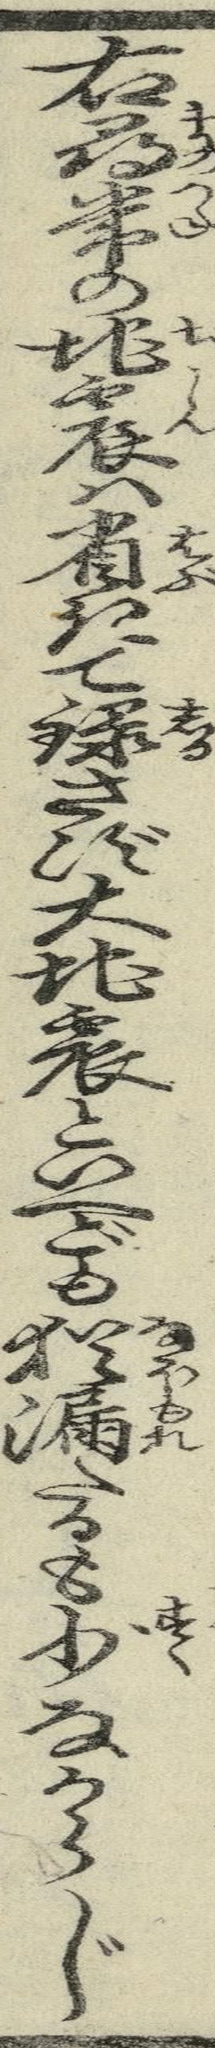右尋常の地震は省きて録さず大地震といへども猶漏たるも少なからじ
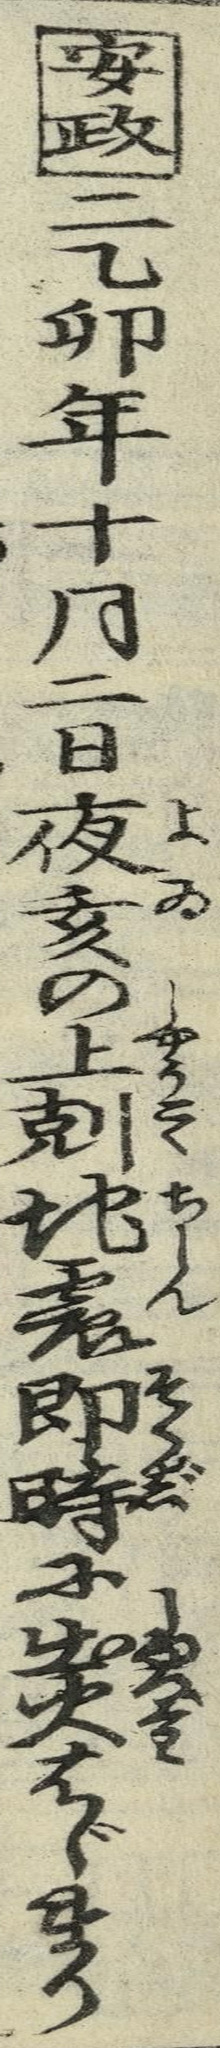安政二乙卯年十月二日夜亥の上刻地震即時に出火はじまり
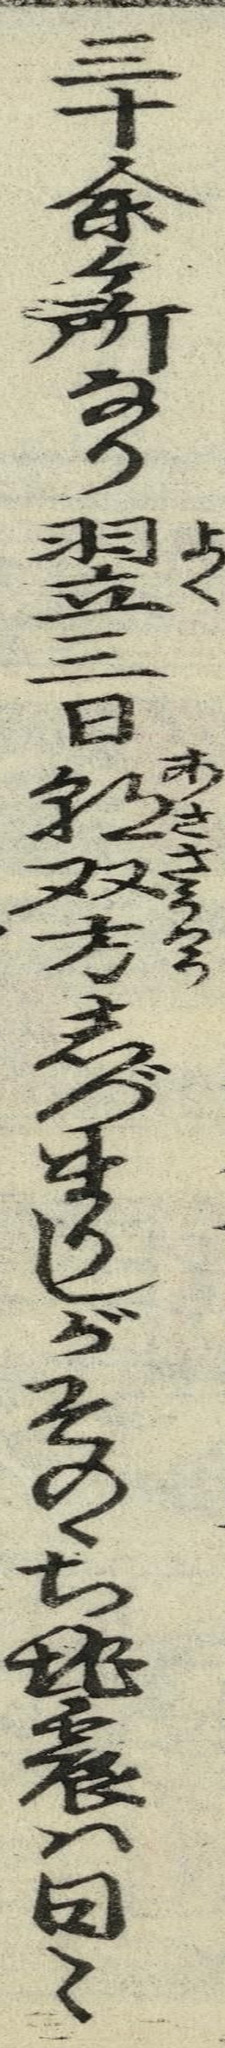三十余ヶ所なり翌三日朝双方しづまりしがそのゝち地震は日〻
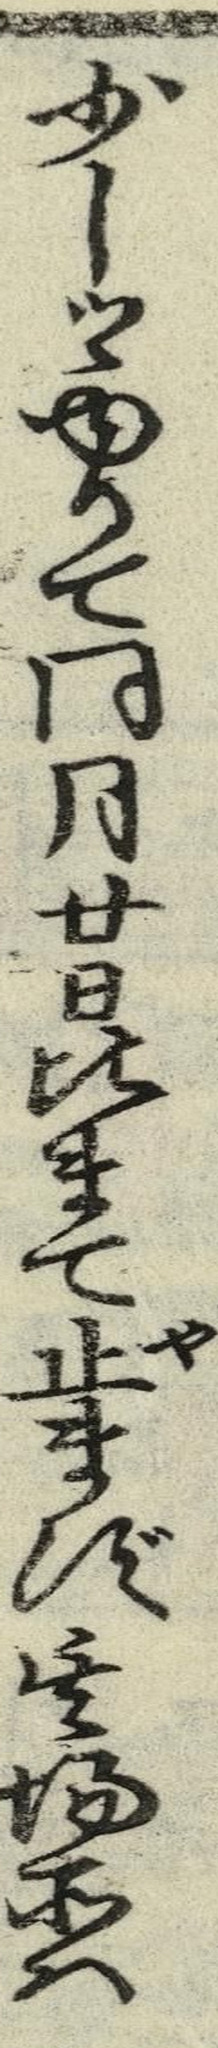少しつゝゆりて同月廿日比まて止まず其場所は
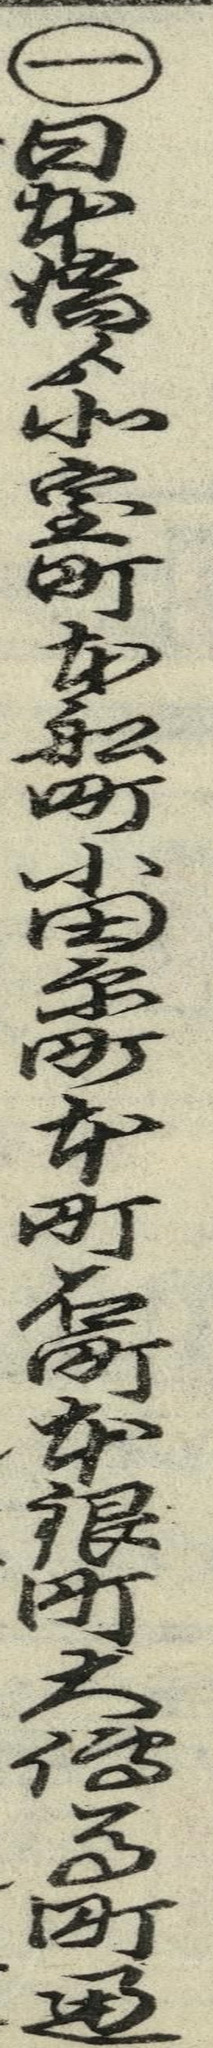㊀日本橋ゟ北室町本舩町小田原町本町石町本銀町大伝馬町辺
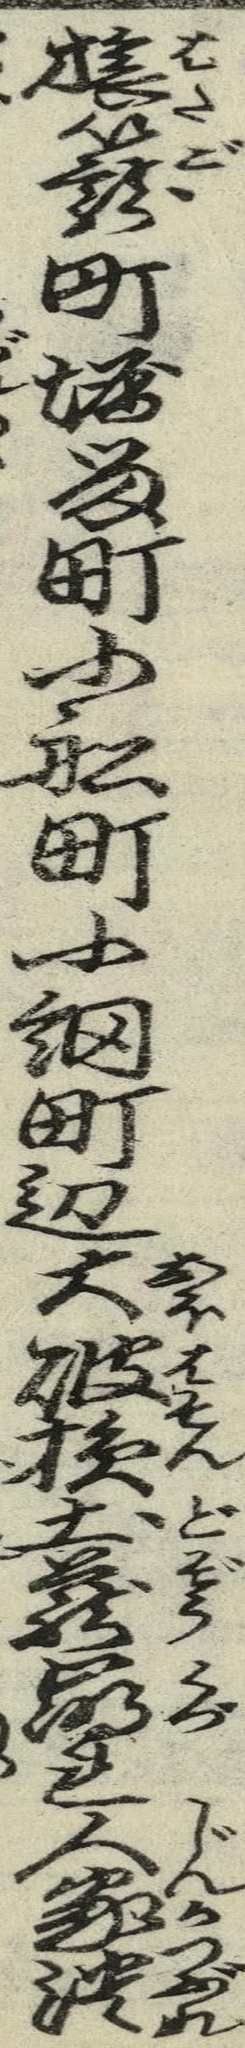旅籠町堀留町小舩町小綱町辺大破損土蔵崩れ人家潰
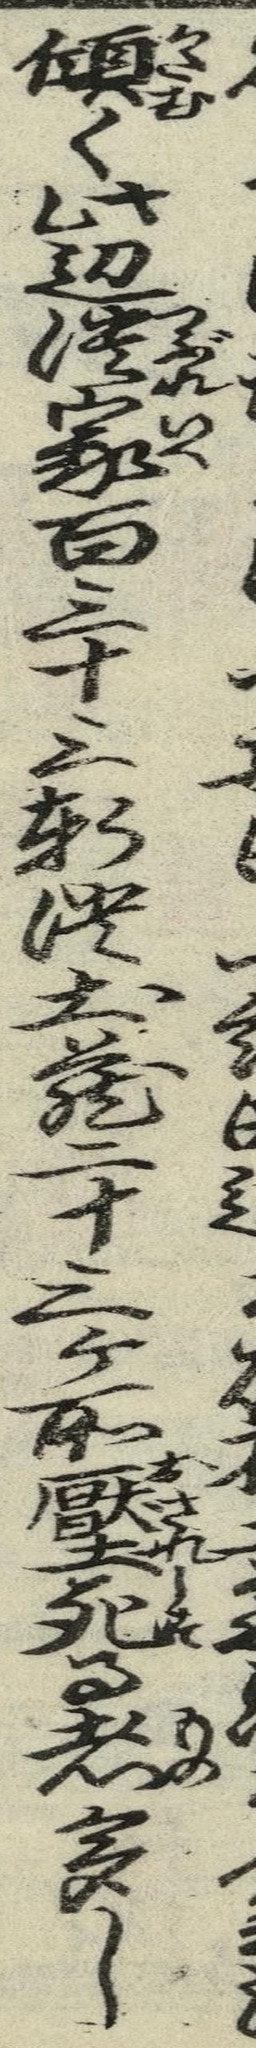傾く此辺潰家百三十三軒潰土蔵二十三ヶ所圧死る者多し
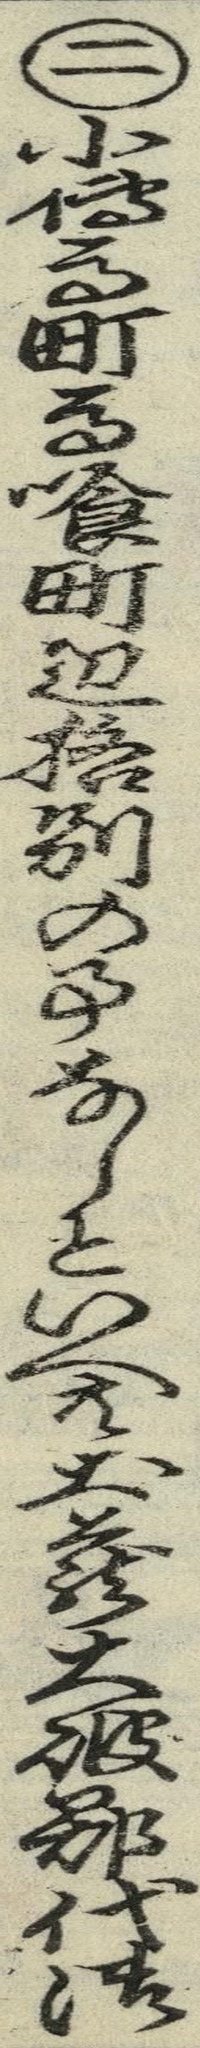㊁小伝馬町馬喰町辺格別の事なしといへ共土蔵大破郡代御
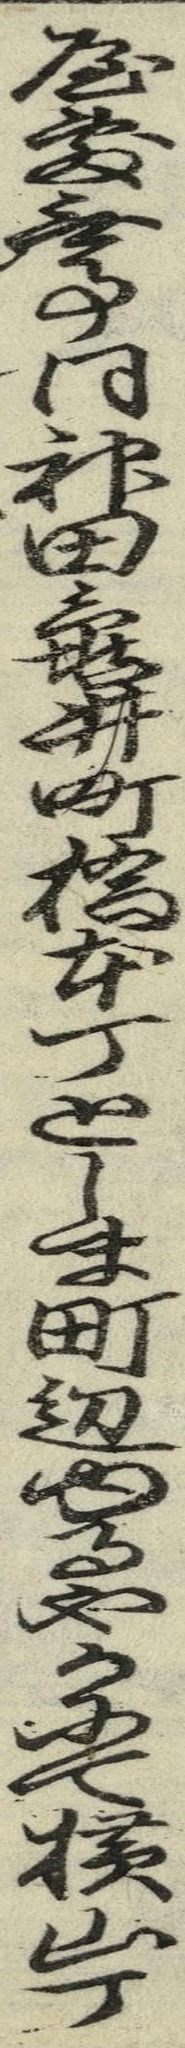屋敷無事同神田亀井町橋本丁としま町辺ゆるやかにて横山丁
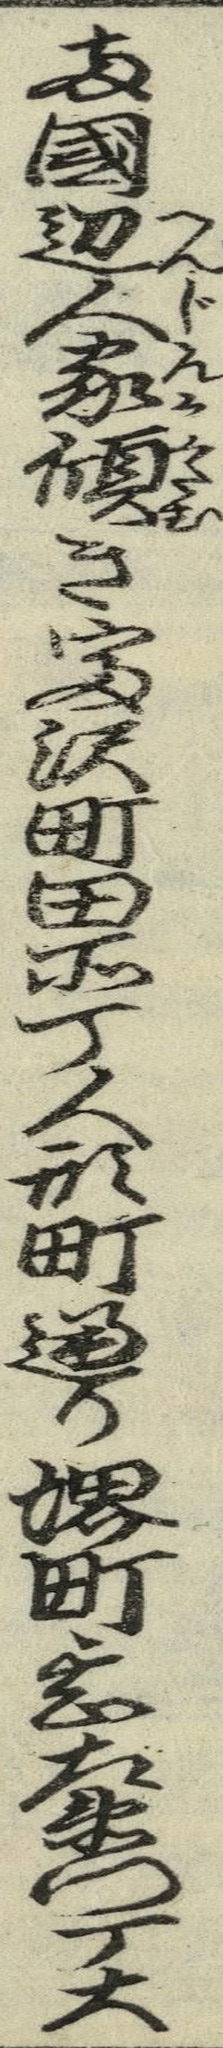両国辺人家傾き富沢町田所丁人形町通り堺町甚左衛門丁大
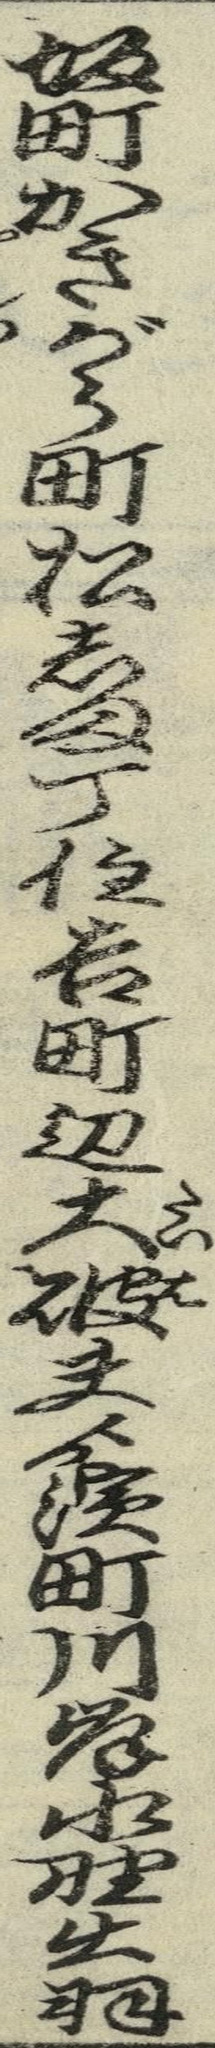坂町かきがら町松しま丁住吉町辺大破夫ゟ浜町川岸水野出羽
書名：地震年代記
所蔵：東京大学地震研究所図書室 Earthquake Research Institute Library, The University of Tokyo, JAPAN
